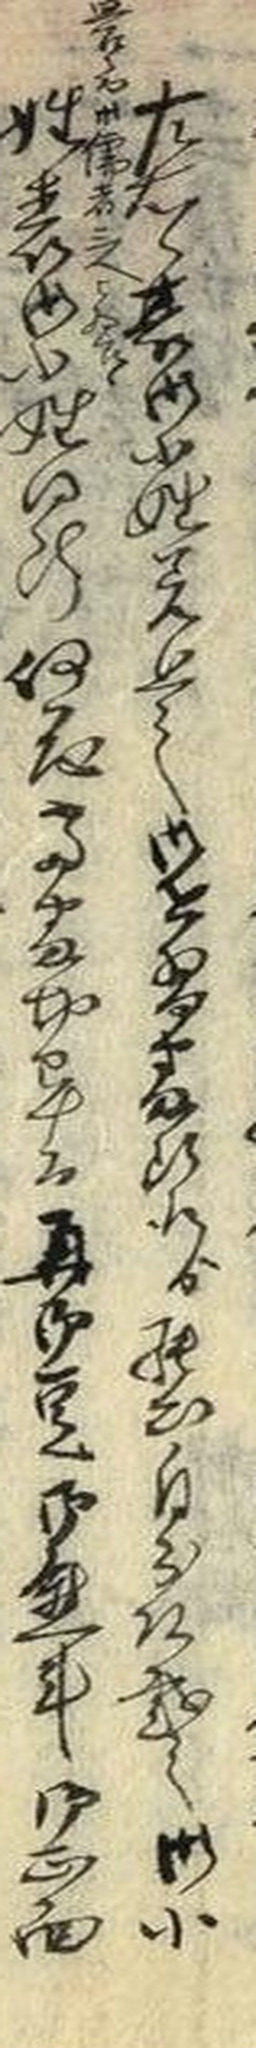姓表御小姓同断何茂当番切畢而再御豆御熨斗御正面
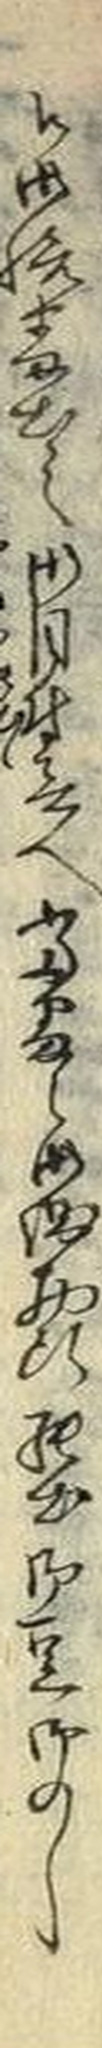江御膳番出之御目付壱人当番之御側物頭罷出御豆御のし
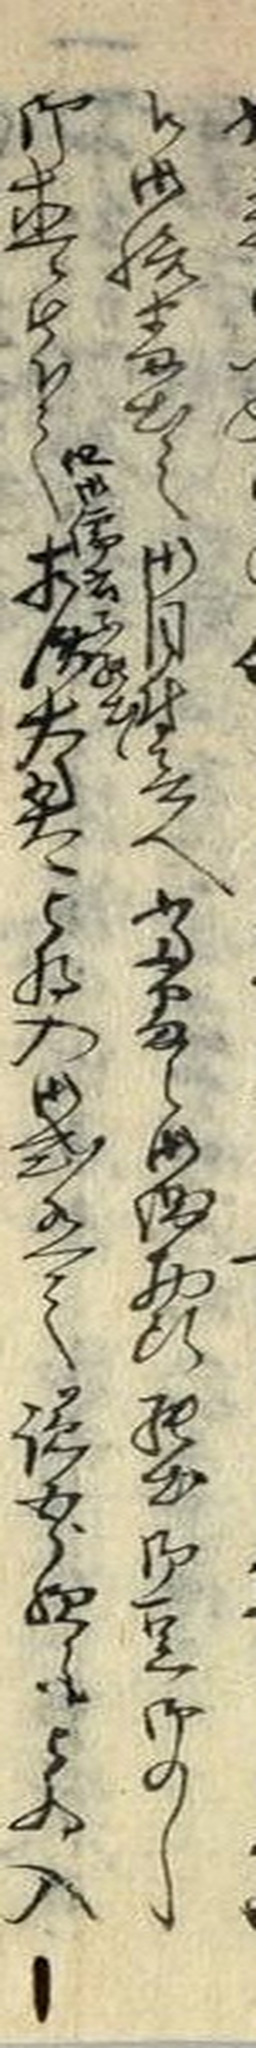御直ニ被下之但御儒者不罷出候相済大奥へ被為入御式有之謙五郎様ニも被為入
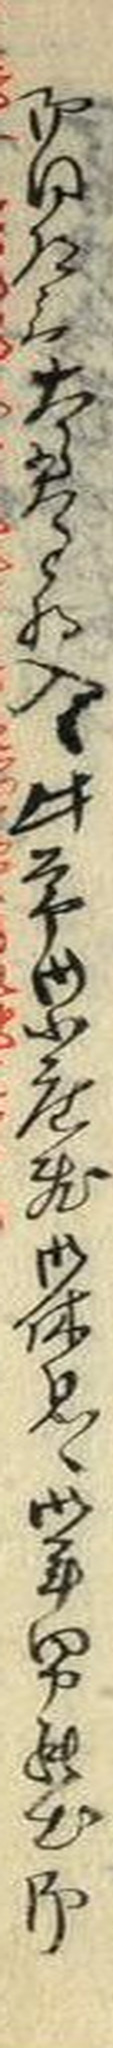御同道ニ而大奥へ被為入候此節御小座敷御休息へ御年男罷出御
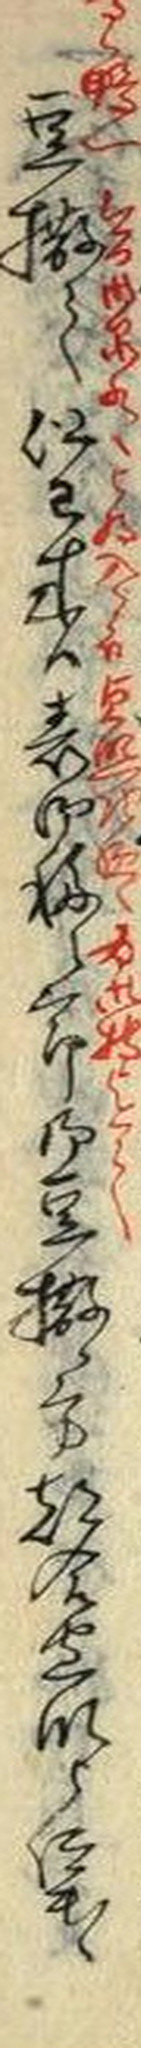豆撒之但已来ハ表御移之節御豆撒候方都合宜段被仰出候

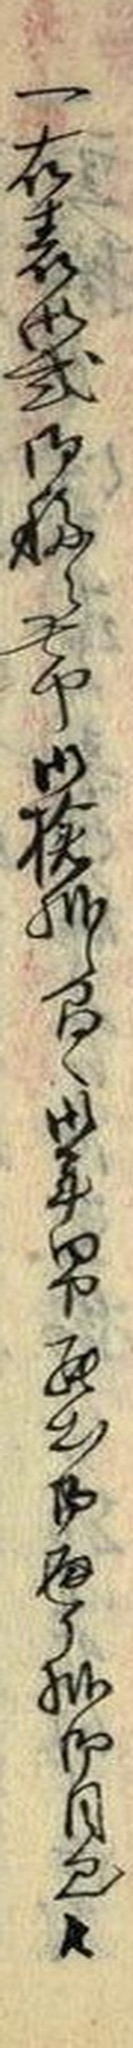一右表御式御移之節御槍掛之間へ御年男罷出御通り掛御目見被
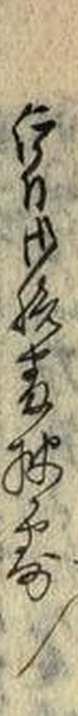仰付御膳番披露
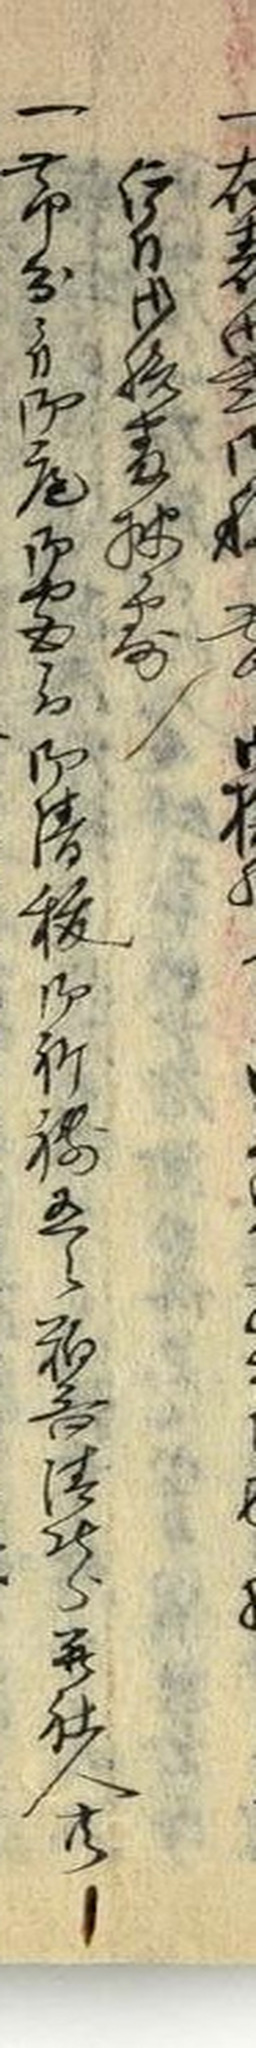一節分ニ付御庭御宮ニ而御清祓御祈祷有之粕谷清次郎幷社人共
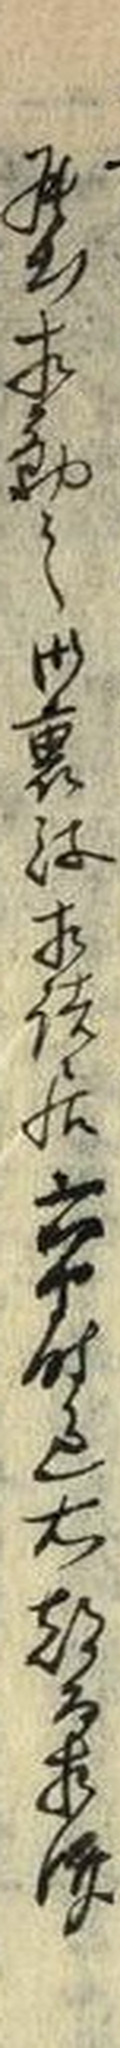罷出相勤之御裏役相詰居六半時過右都而相済
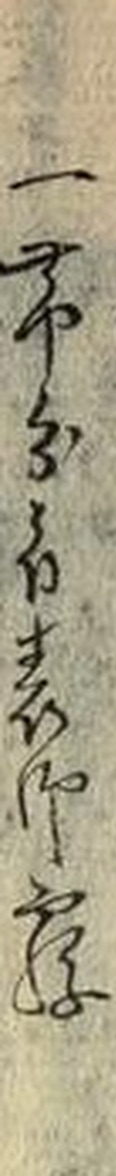一節分ニ付表御寝
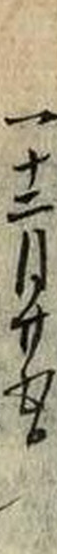一十二月廿五日
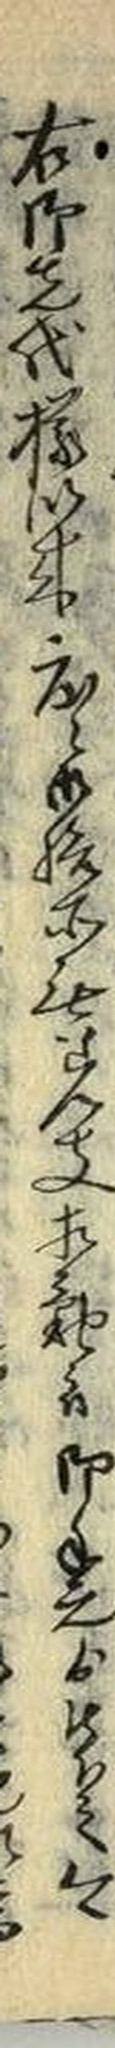右御先代様以来度々御膳所無差支相勤候ニ付御手元ゟ被下之今
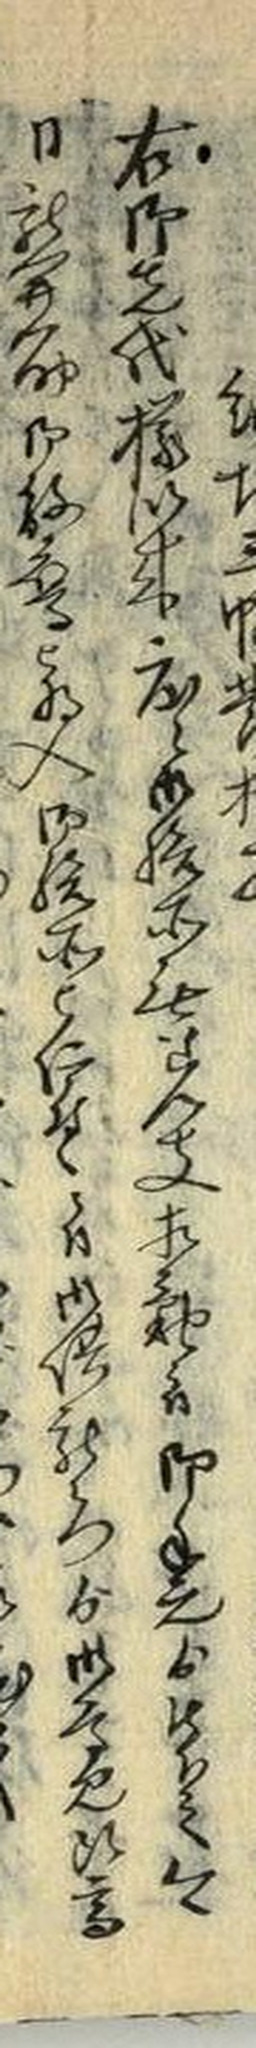日新開筋御放鷹被為入御膳所被仰付候ニ付御供新右衛門ゟ御鳥見頭高
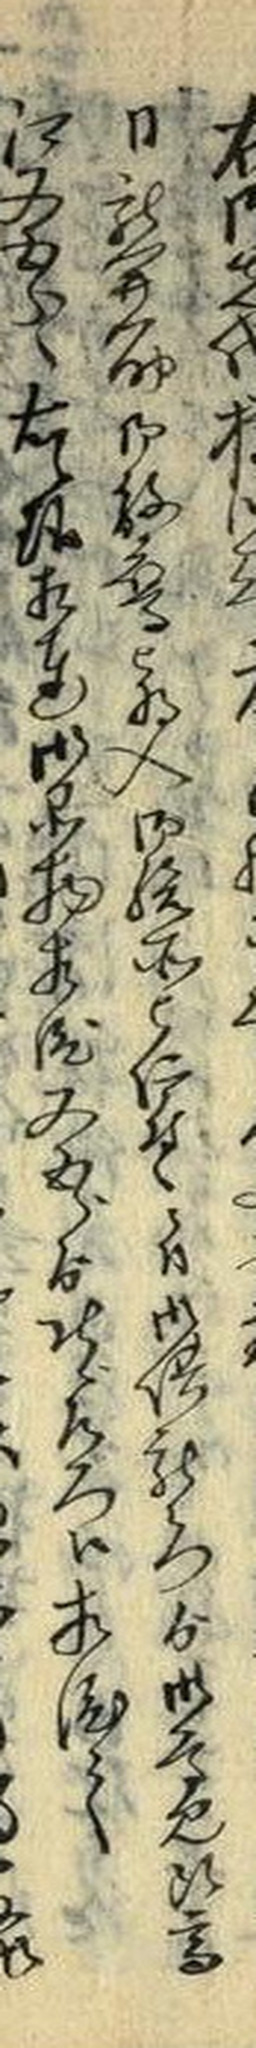江又五郎へ右之趣相達御品物相渡又五郎ゟ次郎左衛門江相渡之
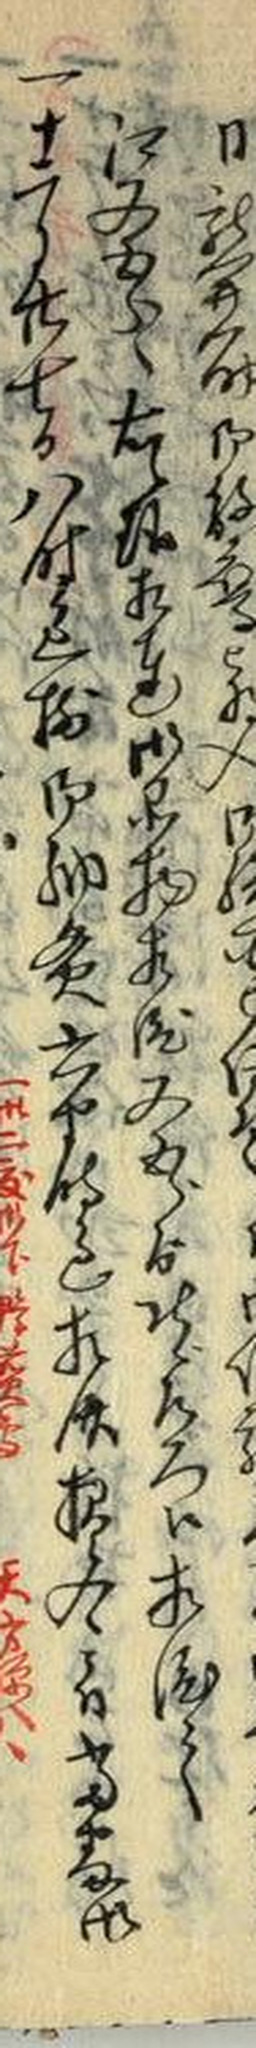一十二月廿七日八時過揃御納灸六半時過相済夜ニ入候ニ付当番御
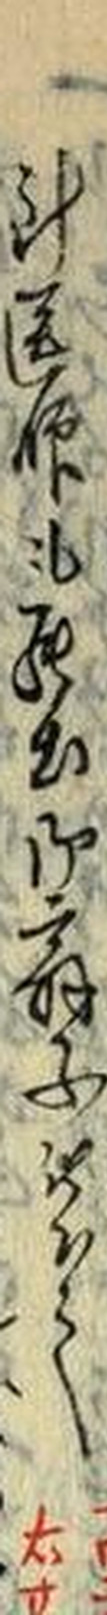針医師も罷出御扇子被下之
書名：少傅日録抄（斉承付側向頭取日記、在国）
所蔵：福井県文書館 Fukui Prefectural Archives
